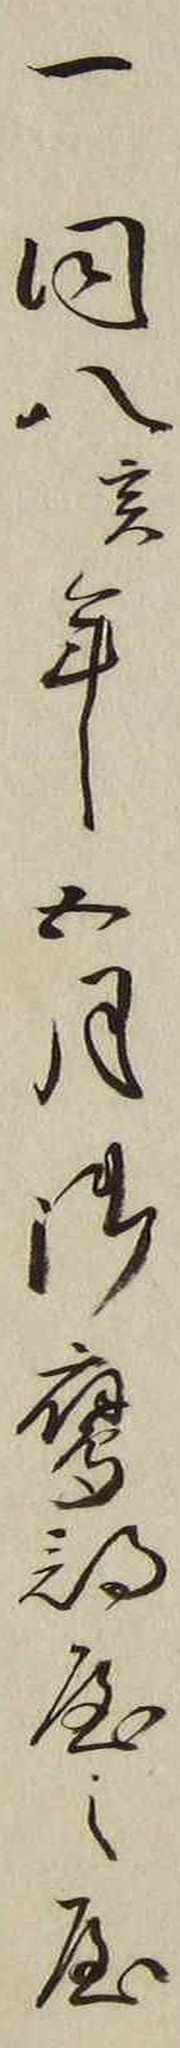一同八亥年五月御鷹部屋之屋

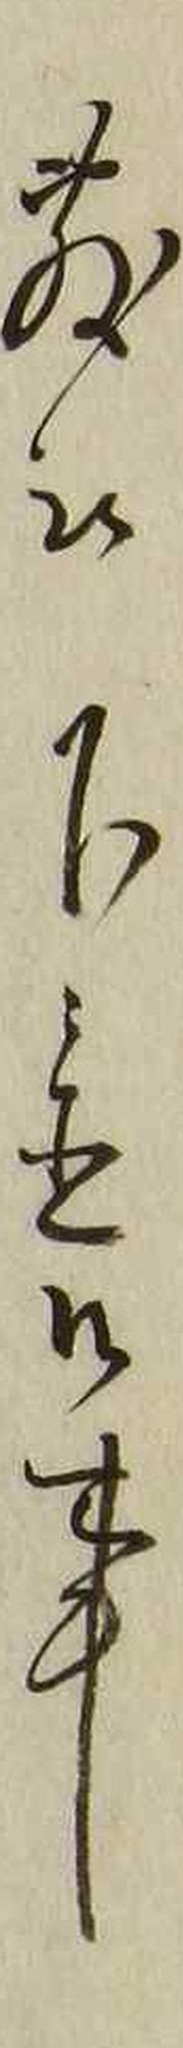敷被下置候事
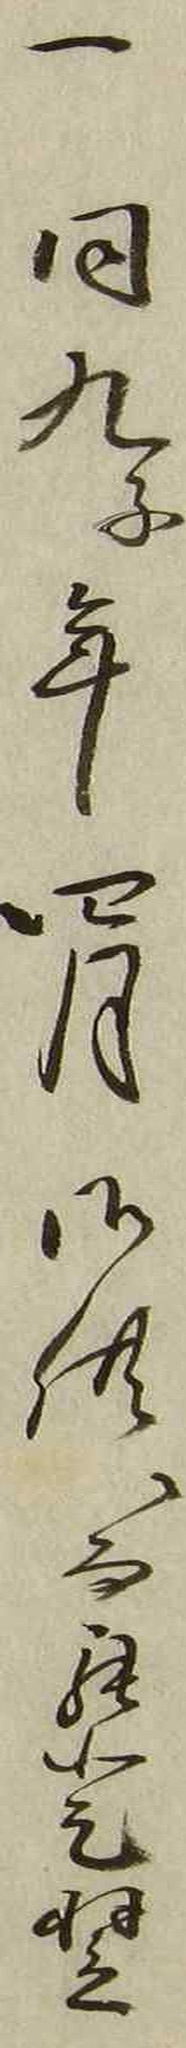一同九子年四月御供に而罷登翌
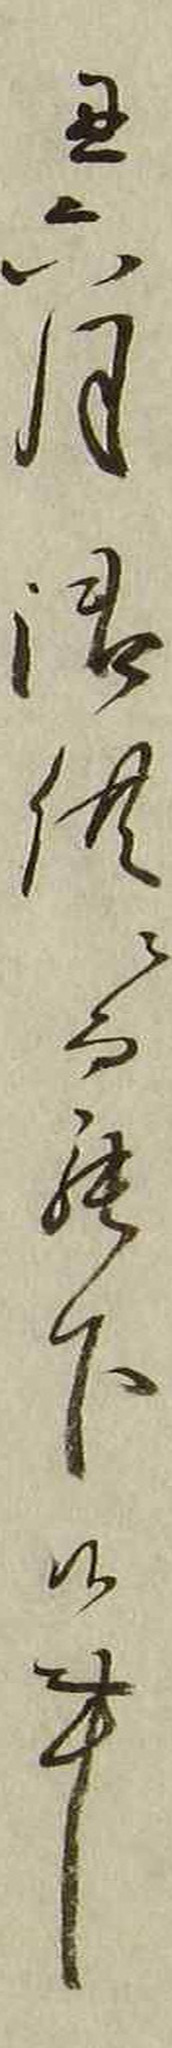丑六月御供に而罷下候事
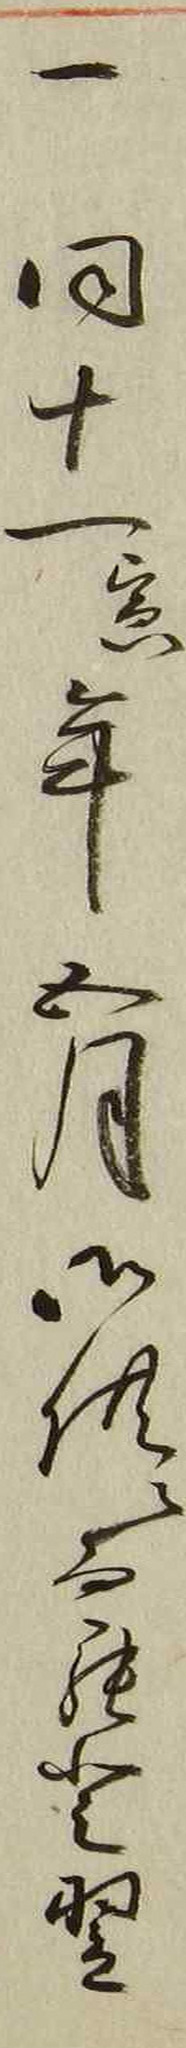一同十一寅年五月御供に而罷登翌
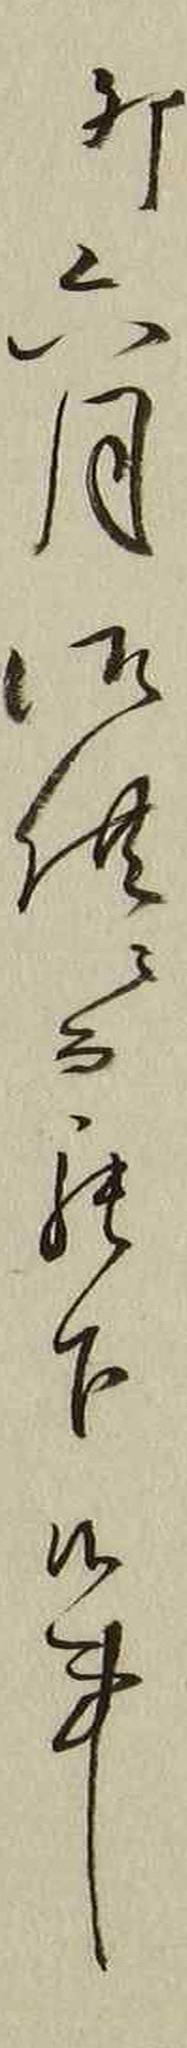卯六月御供に而罷下候事
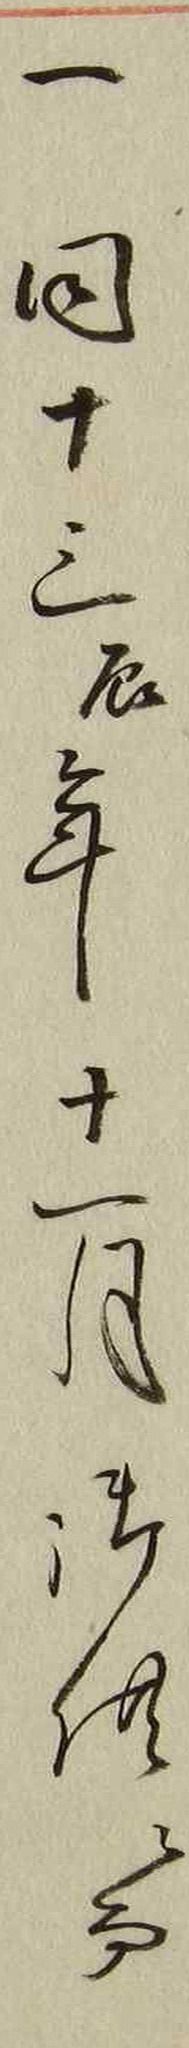一同十三辰年十一月御供に而
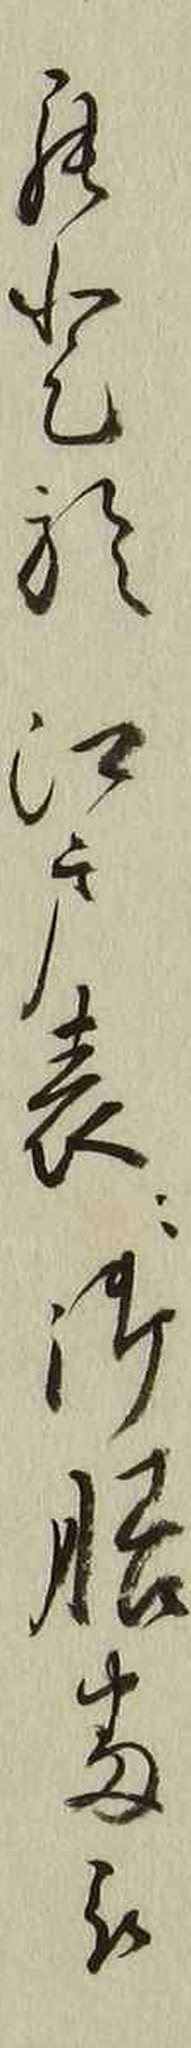罷登於江戸表に御膳番被
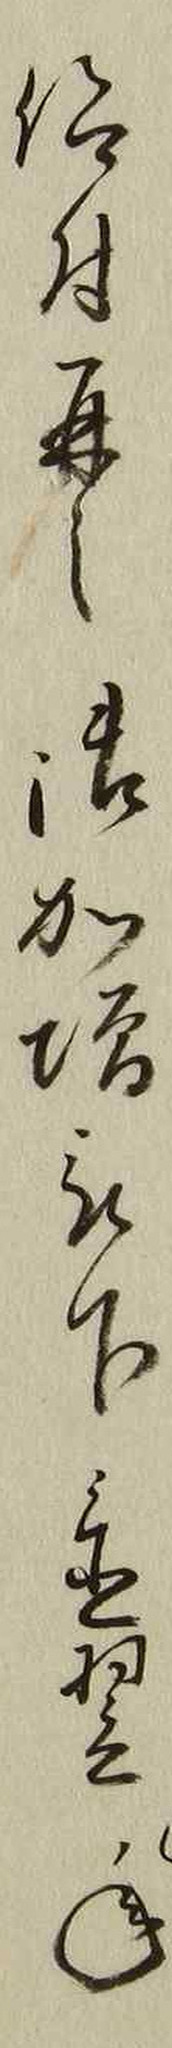仰付再之御加増被下置翌巳年
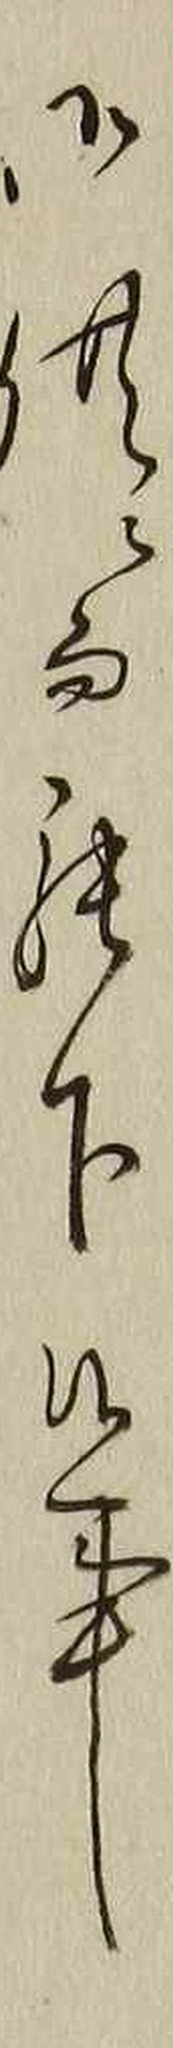御供に而罷下候事
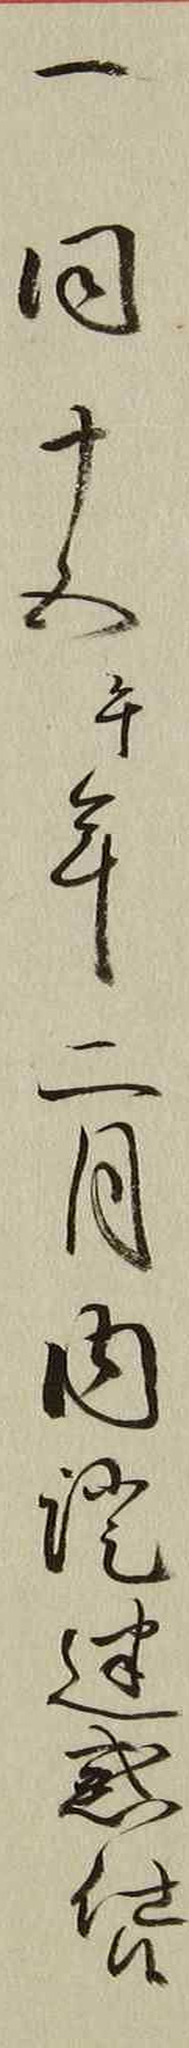一同十五午年二月内證迷惑仕候
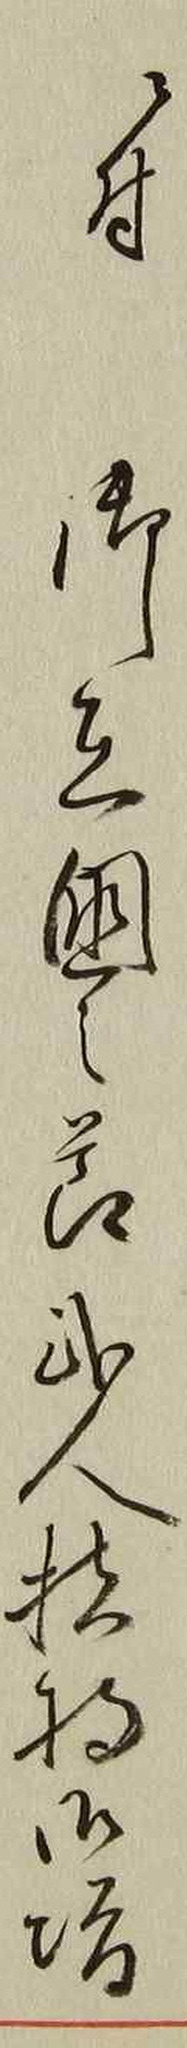に付御在国之節弐人扶持御増
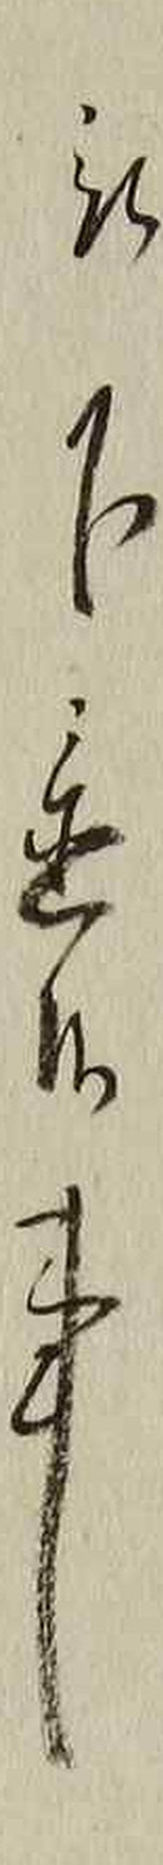被下置候事
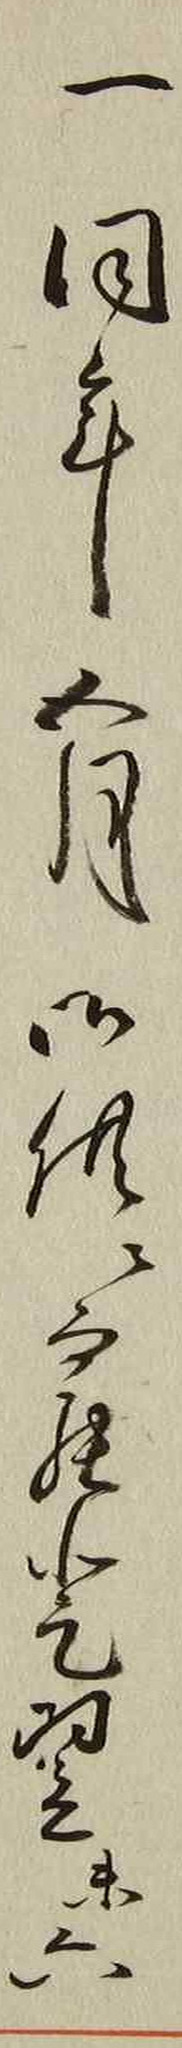一同年五月御供に而罷登翌未六
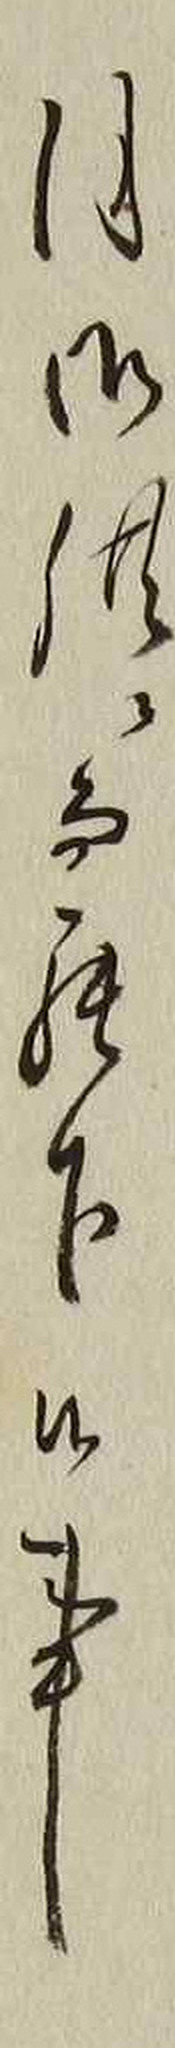月御供に而罷下候事
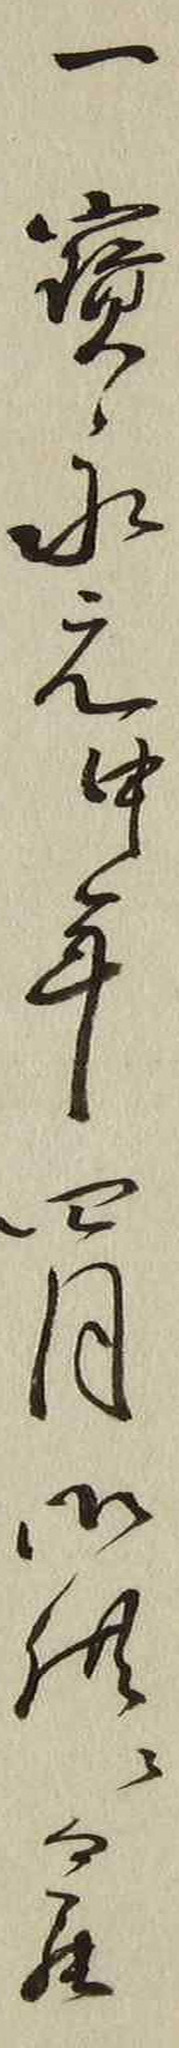一宝永元申年四月御供に而罷
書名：諸士系譜　巻之6　い之部6
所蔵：会津若松市立会津図書館
